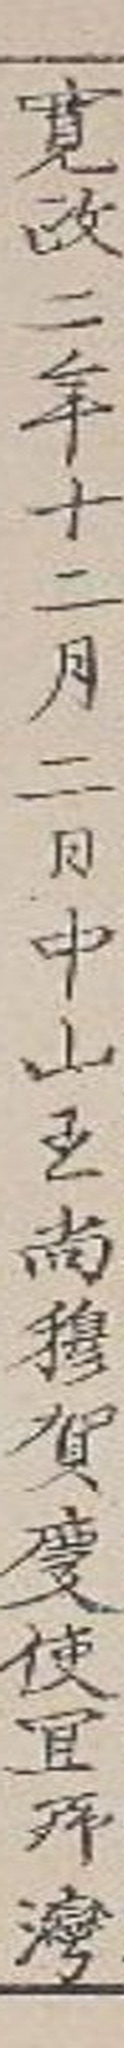寛政二年十二月二日、中山王尚穆、賀慶使宜野湾
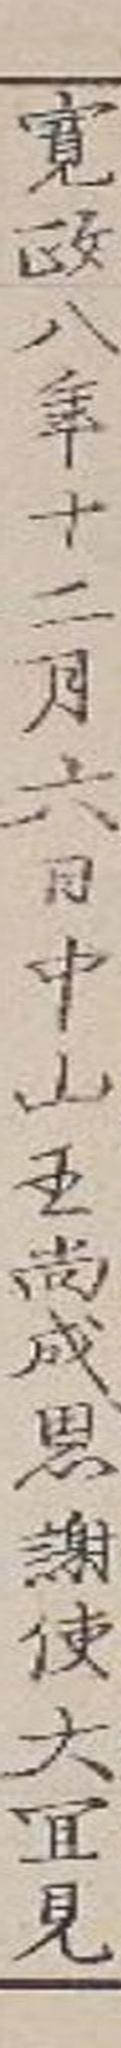寛政八年十二月六日、中山王尚成、恩謝使大宜見
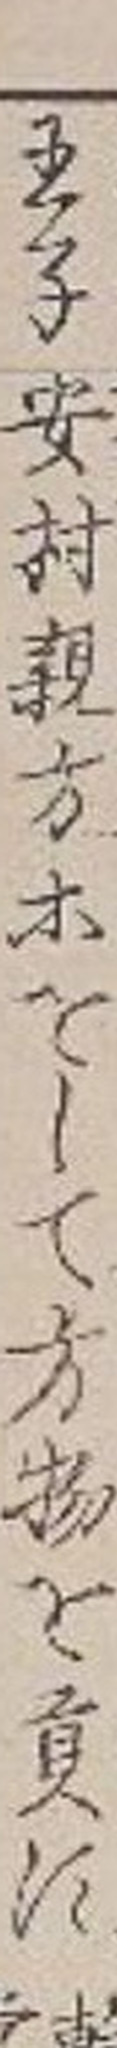山王子小録親方等をして、方物を貢す、
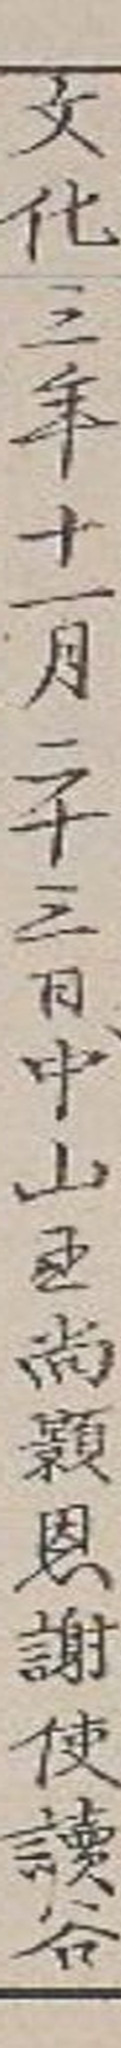文化三年十一月二十三日、中山王尚顥、恩謝使読谷
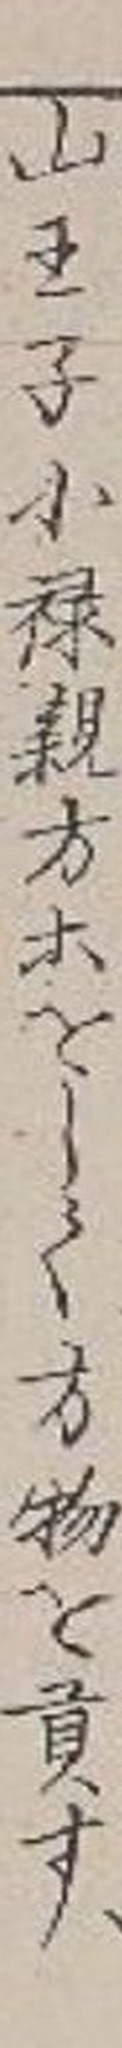山王子小録親方等をして、方物を貢す、
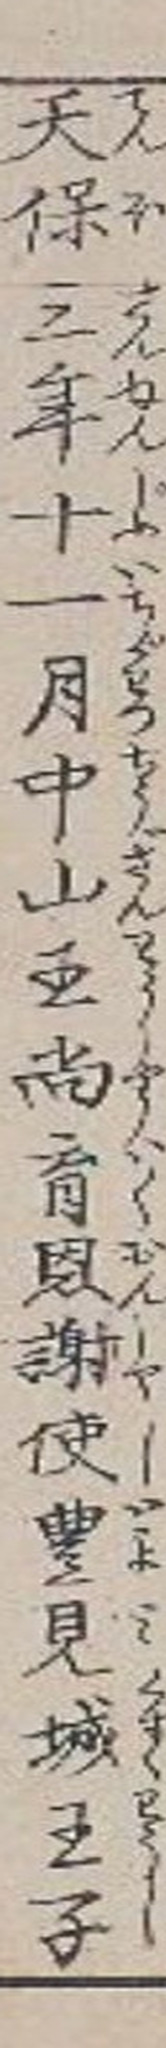天保三年十一月中山王尚育恩謝使豊見城王子
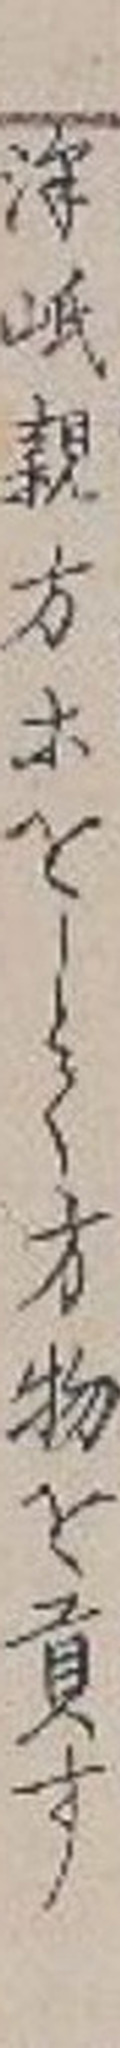沢岻親方等をして方物を貢す

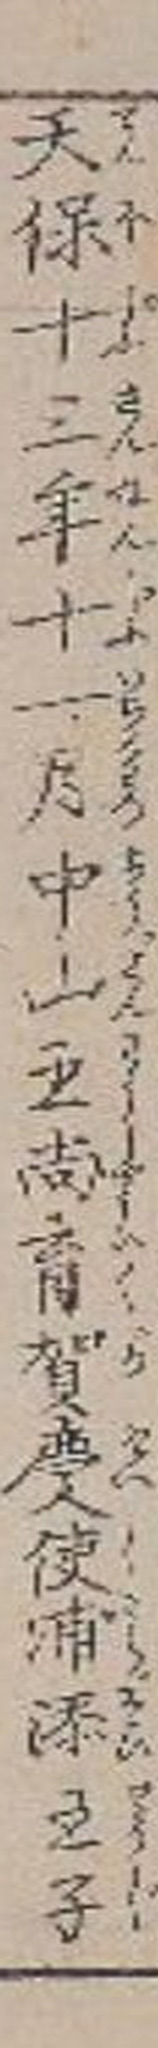天保十三年十一月中山王尚育賀慶使浦添王子
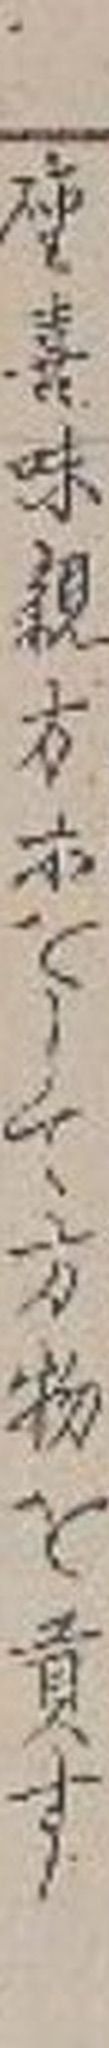座喜味親方等をして方物を貢す
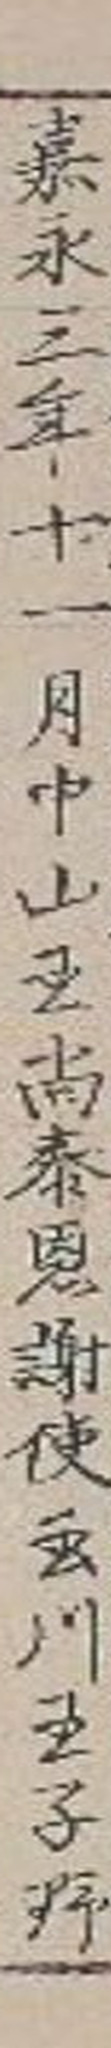嘉永三年十一月中山王尚泰恩謝使玉川王子野
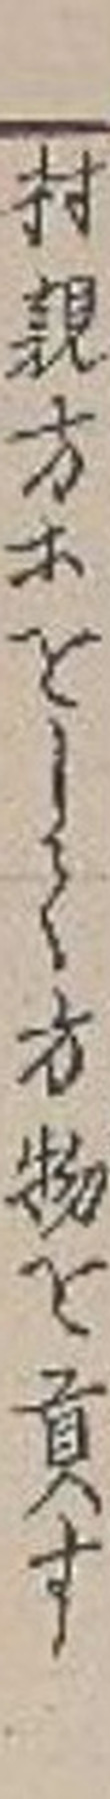村親方等をして方物を貢す
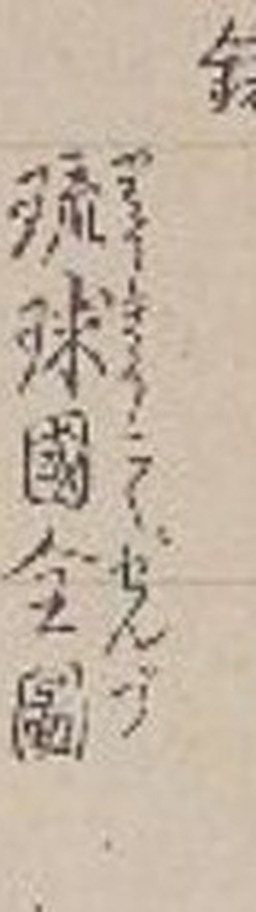琉球国全図
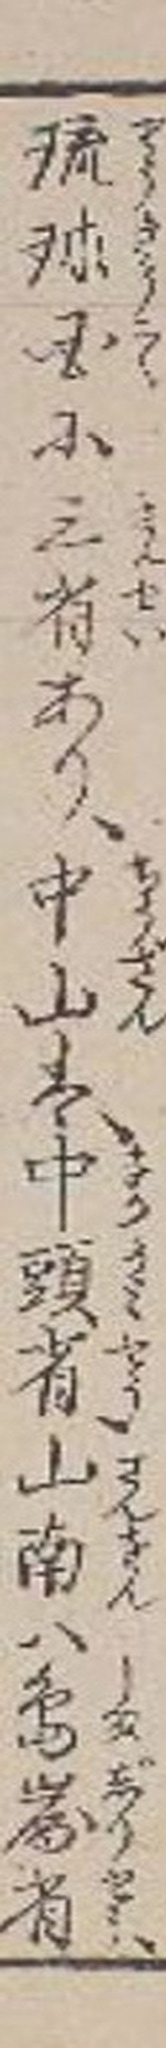琉球国に三省あり、中山は、中頭省、山南は島省、
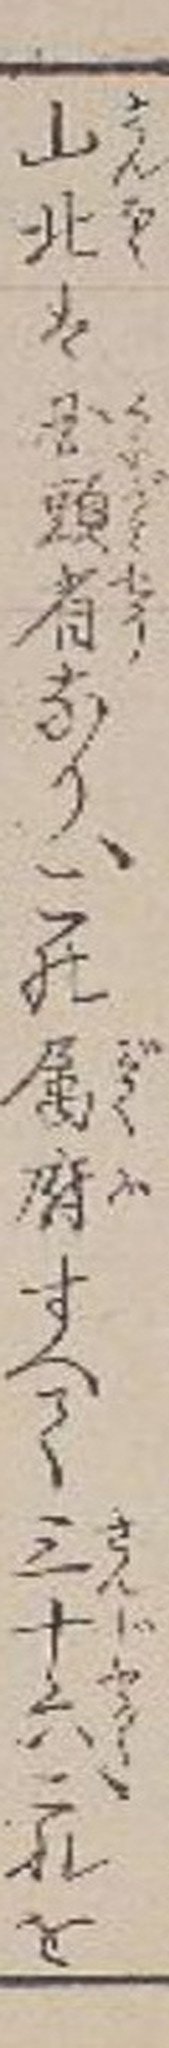山北は国頭省なり、この属府すへて三十六、これを
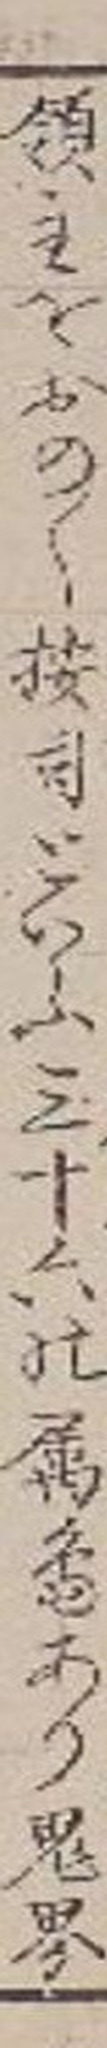領主を、おの〳〵按司といふ、三十六の属島あり、鬼界
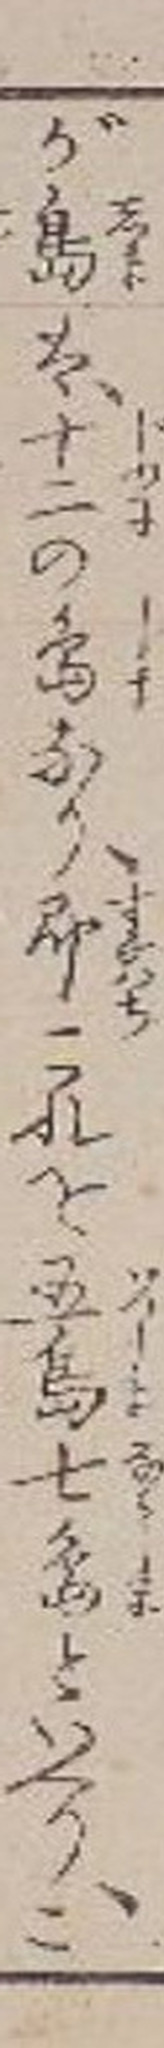が島は、十二の島なり、即これを五島七島といへり、こ
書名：琉球入貢紀略
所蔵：University of the Ryukyus Library
